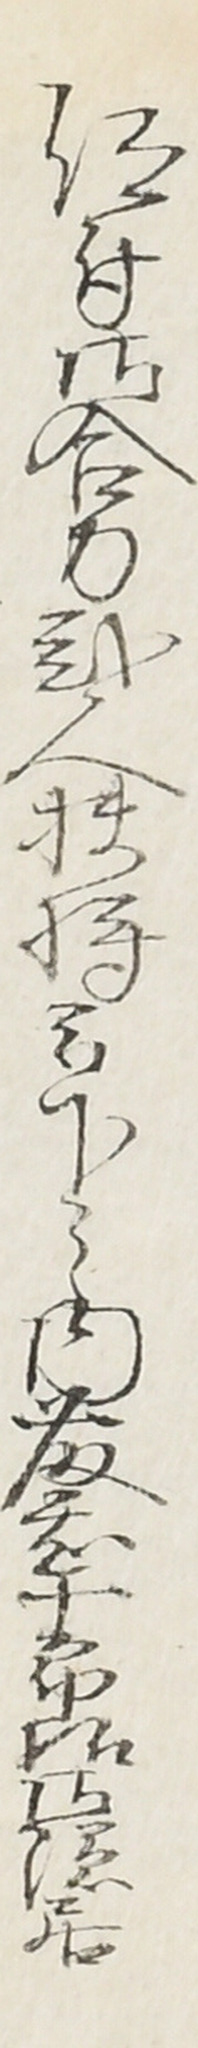仰付御合力弐人扶持被下之内藤甚十郎様御隠居
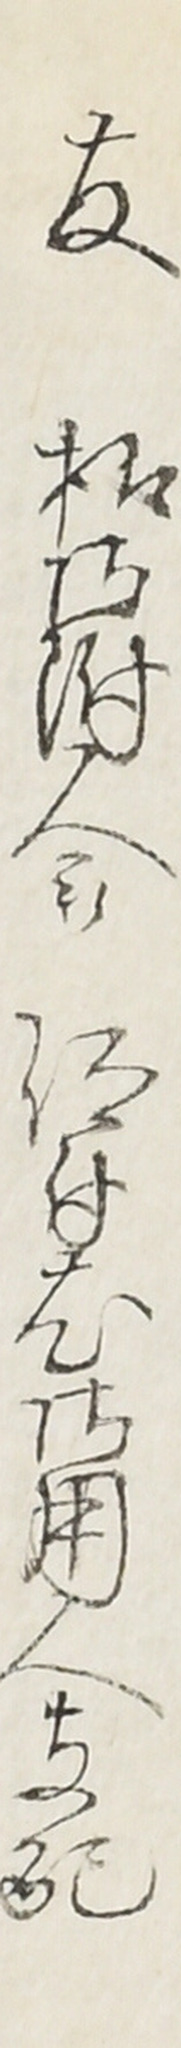友様御附人被仰付尤御用人支配
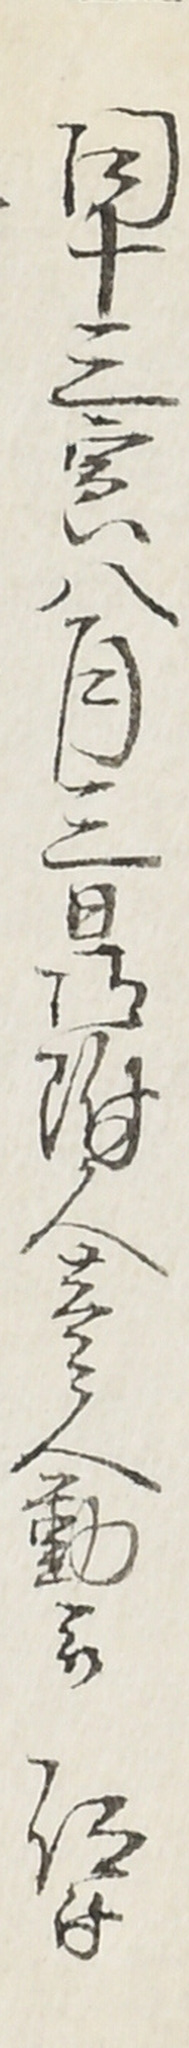一同十三寅八月三日御附人壱人勤被仰付
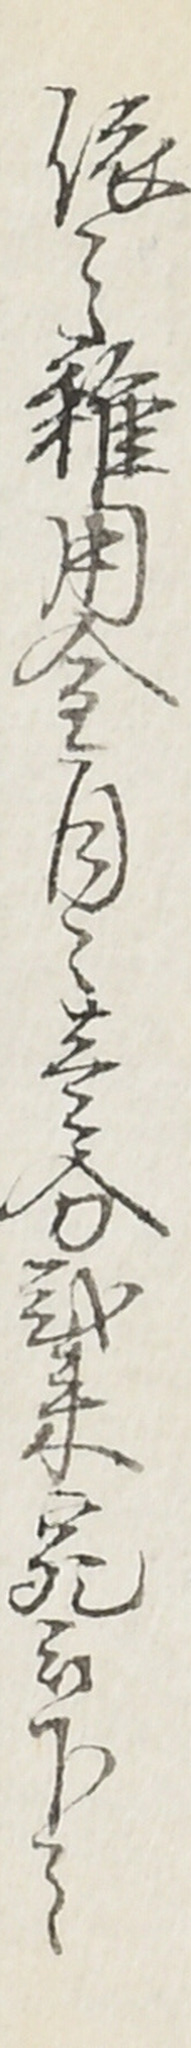依之雑用金月々壱分弐朱宛被下之
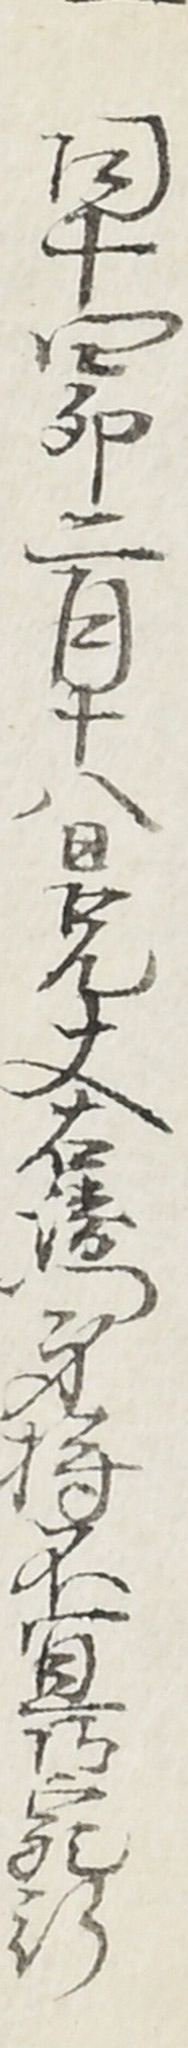一同十四卯二月十八日兄丈右衛門身持不宜御宛行
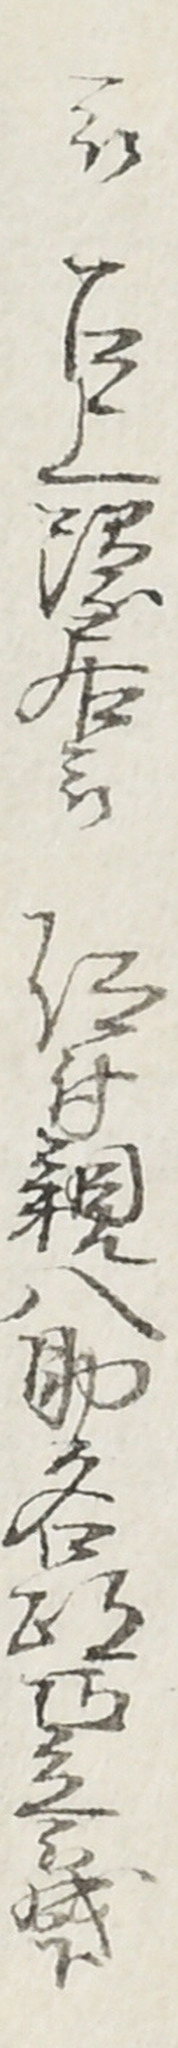被召上隠居被仰付親八助名跡御立被成下
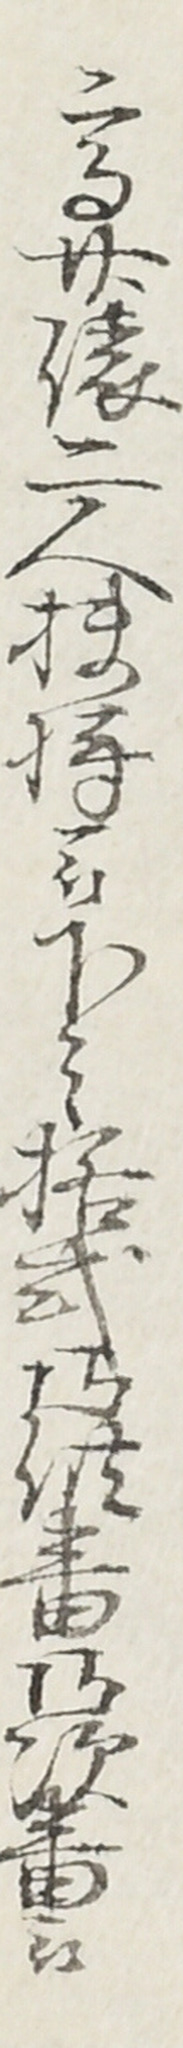高廿俵二人扶持被下之格式御供番御次番被
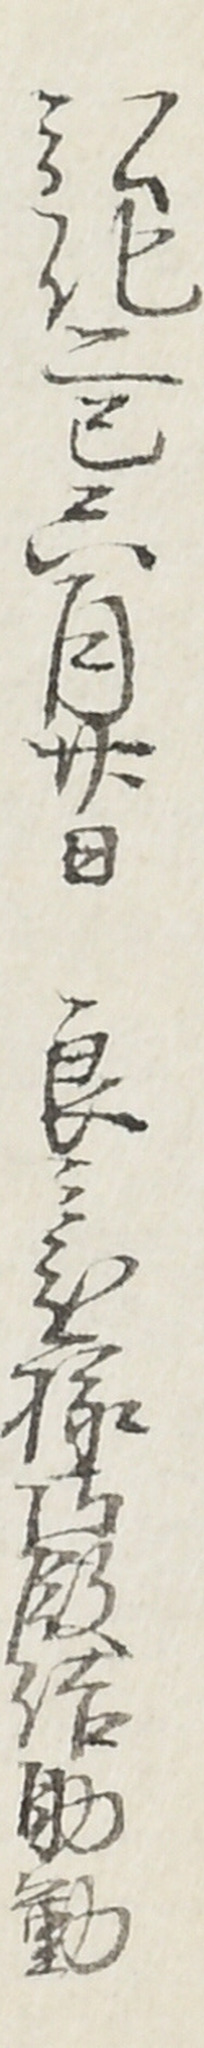一弘化二巳六月廿日良之進様御殿詰助勤
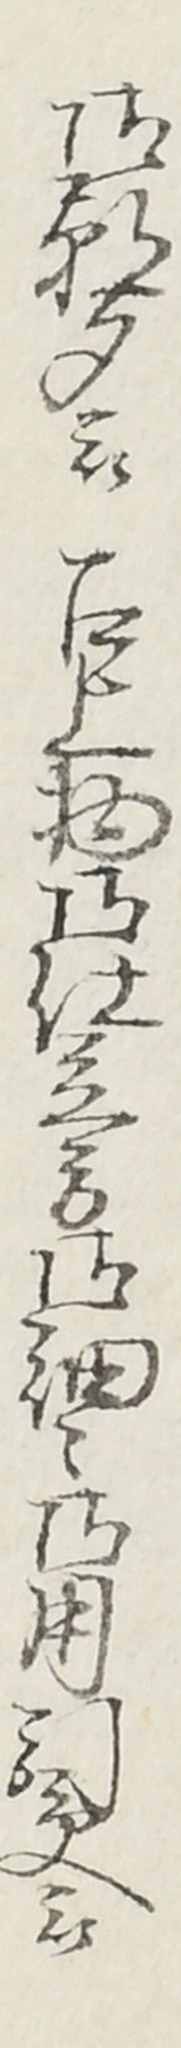御朝夕被召上物御仕立方御細々御用引受被
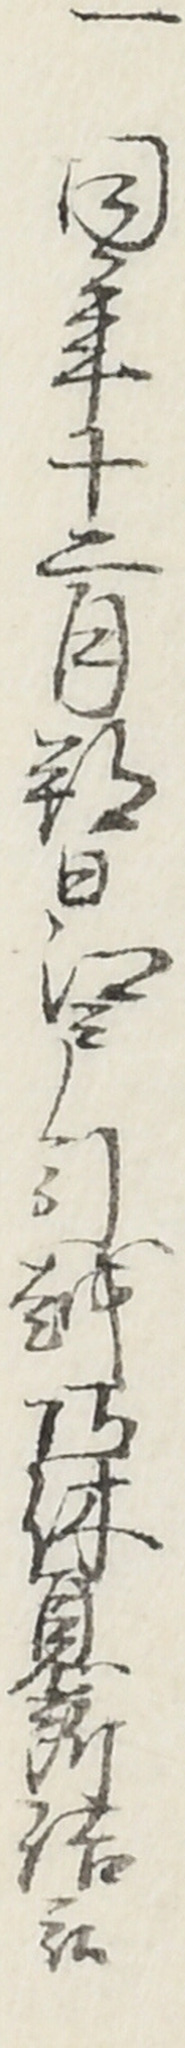一同年十二月朔日江戸引越御休息所詰被

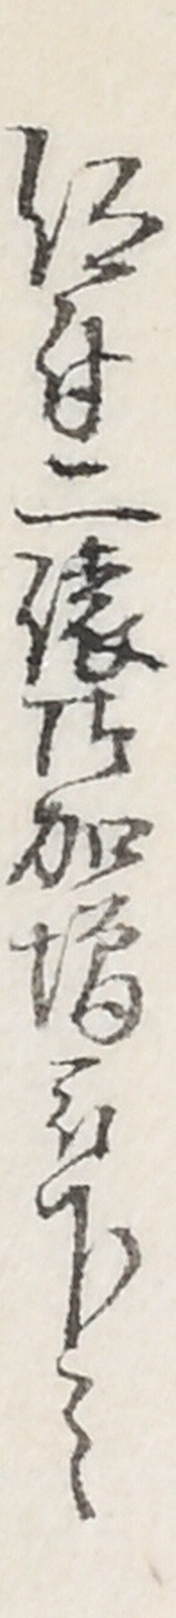仰付二俵御加増被下之
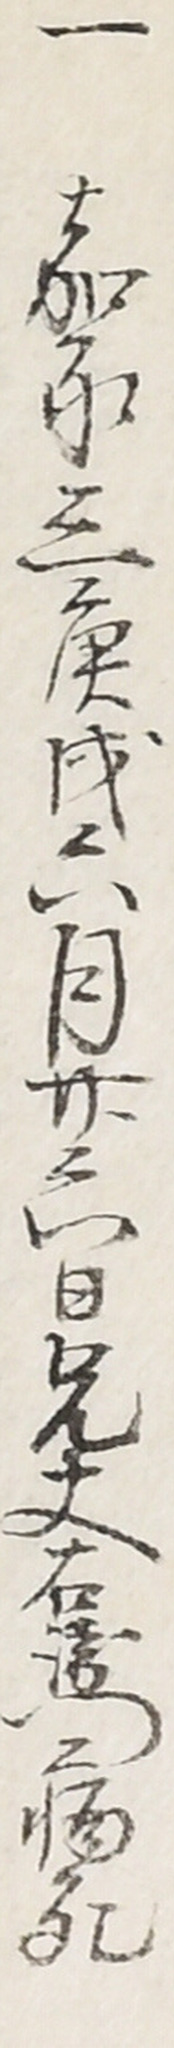一嘉永三庚戌六月廿六日兄丈右衛門病死
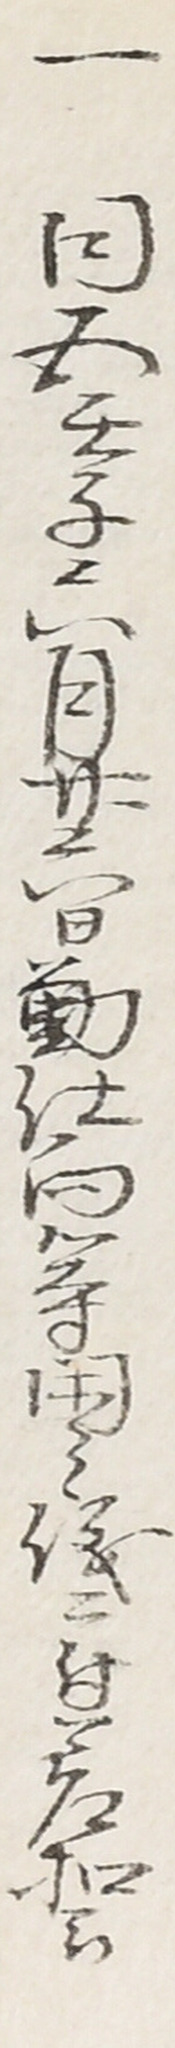一同五壬子六月廿六日勤仕向等閑之儀ニ付差控被
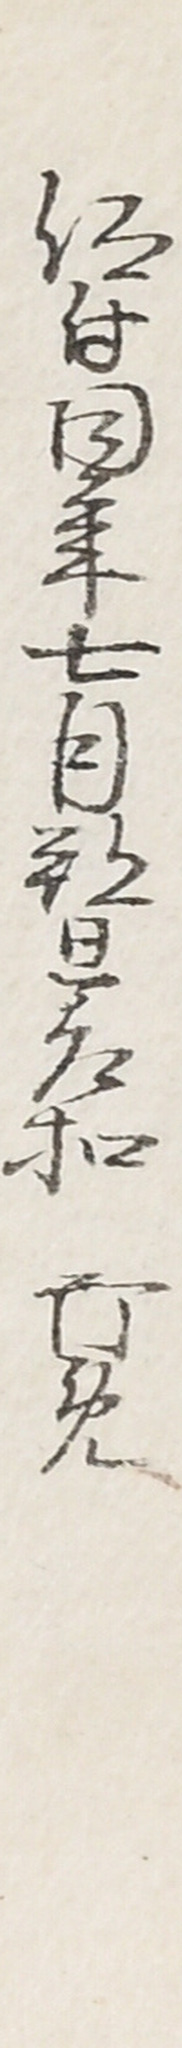仰付同年七月朔日差控御免
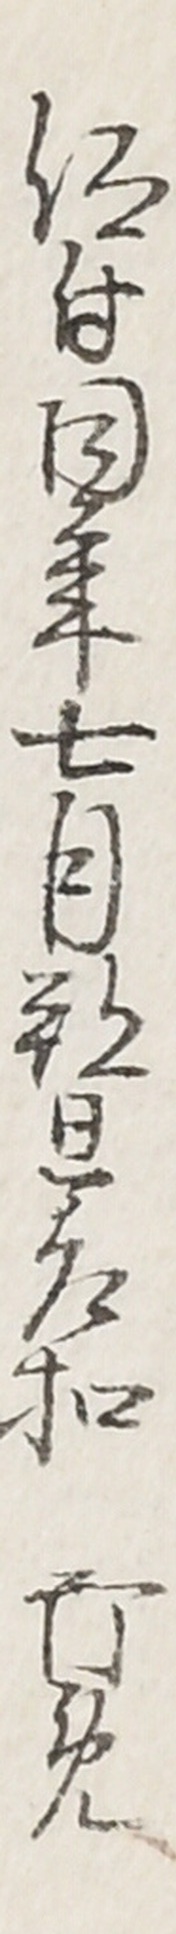仰付同年七月朔日差控御免
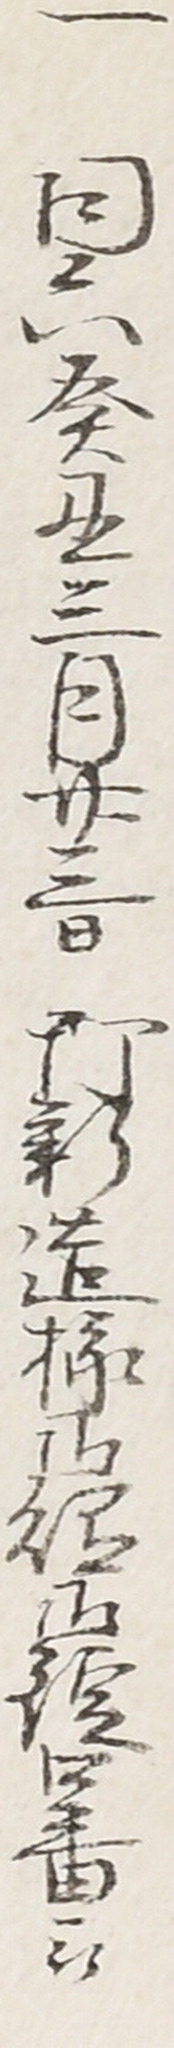一同六癸丑三月廿三日御新造様御賄御錠口番被
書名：給人諸士勤仕録（七）
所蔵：伊那市立高遠町図書館・合同会社AMANE
